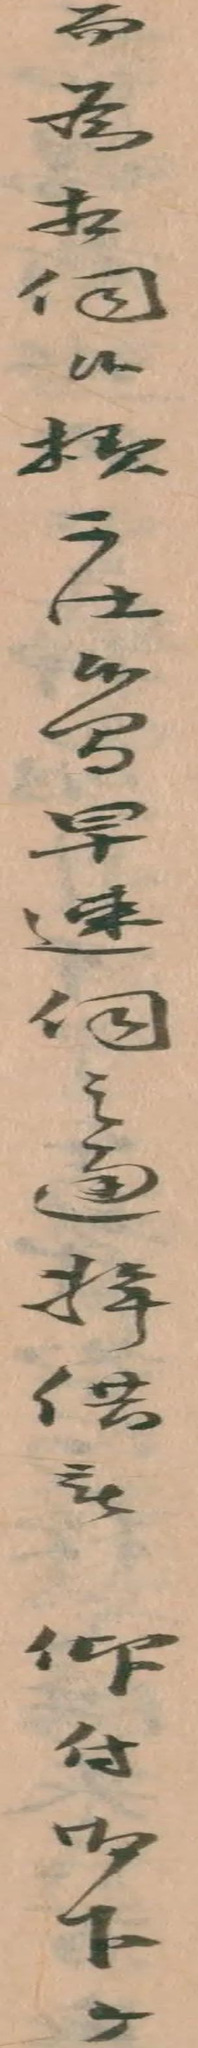而為相伺候様可仕候間早速伺之通拝借被仰付御下ケ
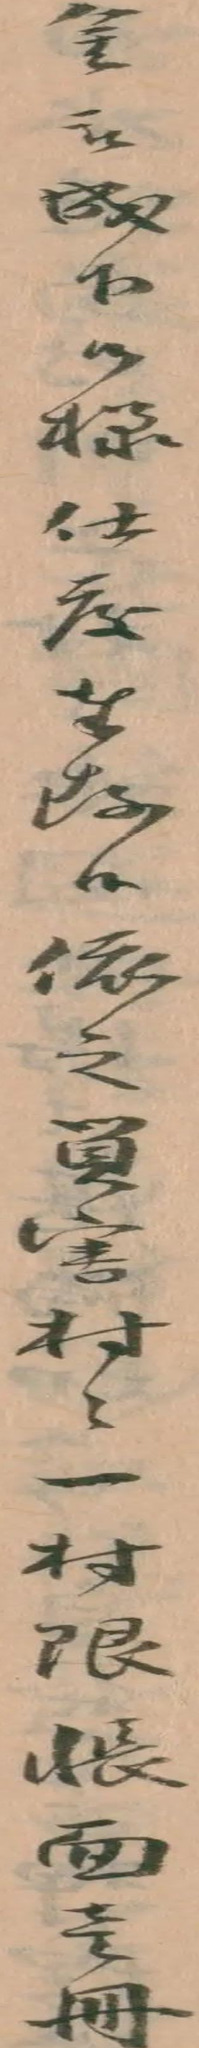金被成下候様仕度奉存候依之災害村々一村限帳面壱冊
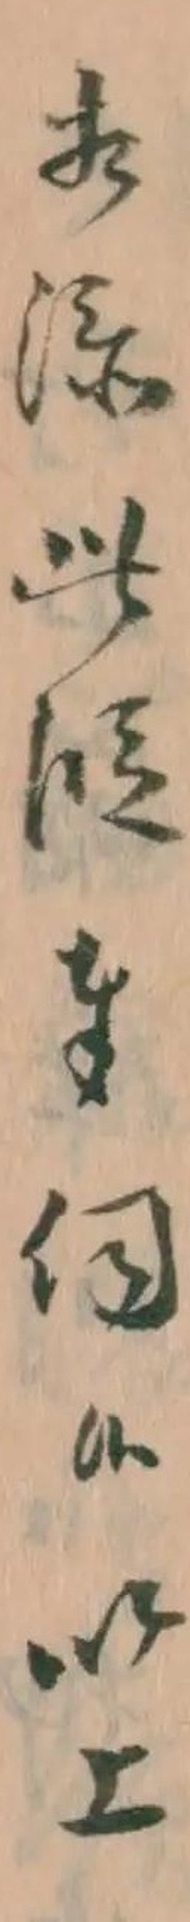相添此段奉伺候以上
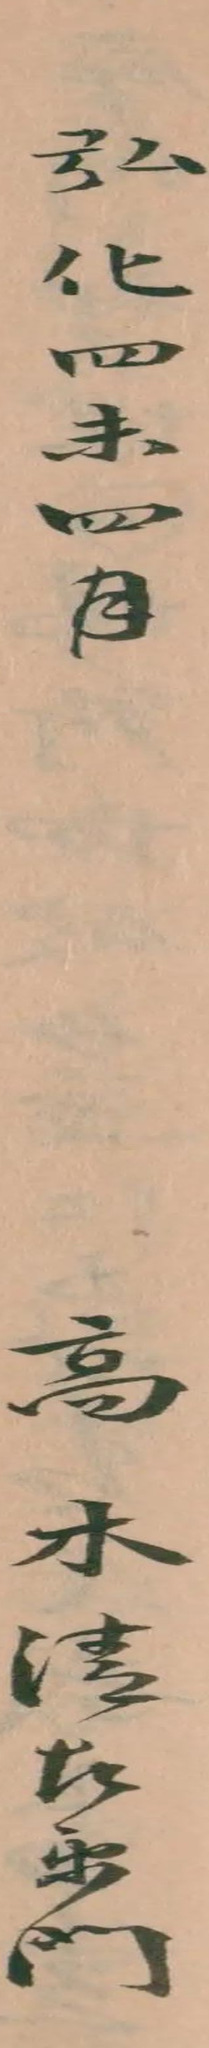弘化四未四月高木清左衛門
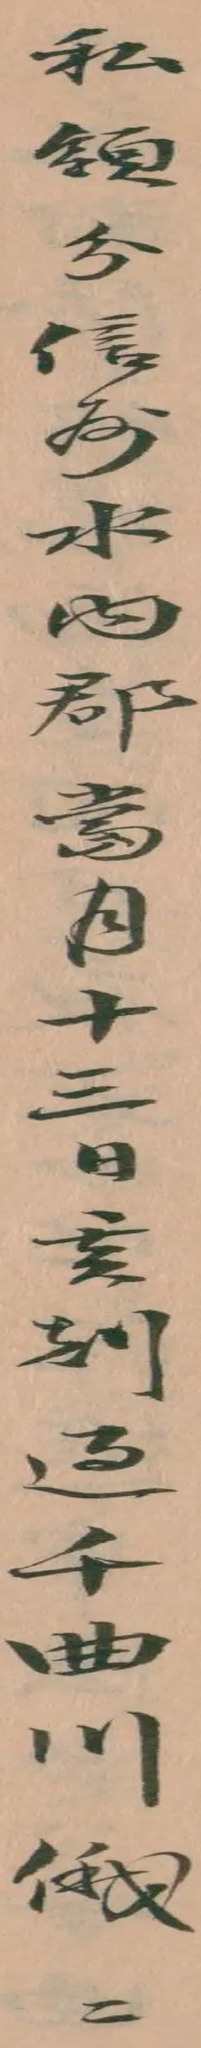私領分信州水内郡当月十三日亥刻過千曲川俄二
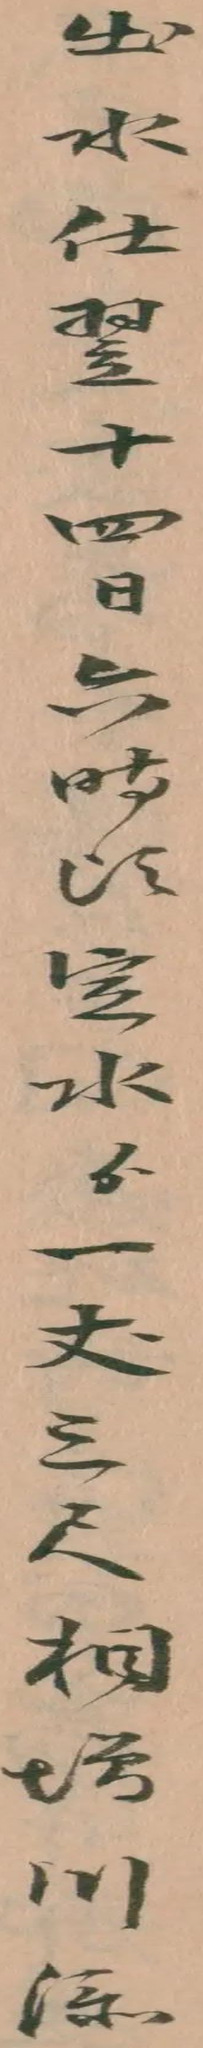出水仕翌十四日六時頃定水ゟ一丈三尺相増川添
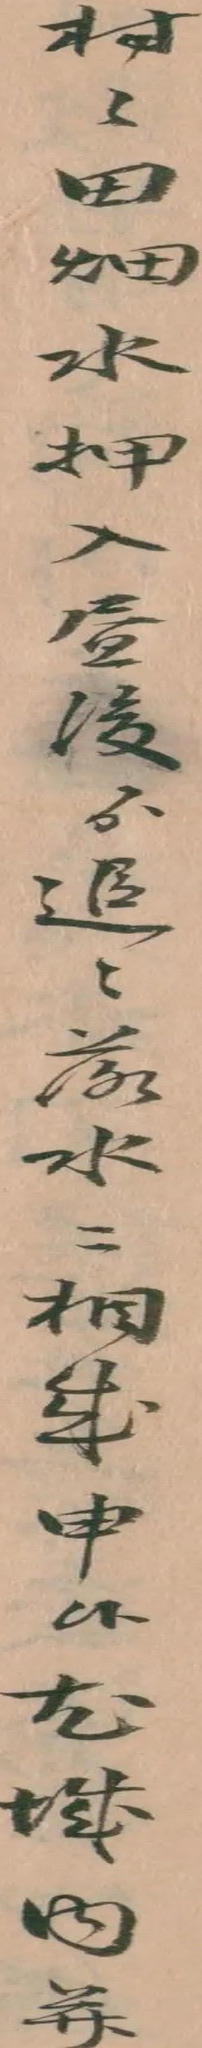村々田畑水押入昼後ゟ追々落水二相成申候尤城内并
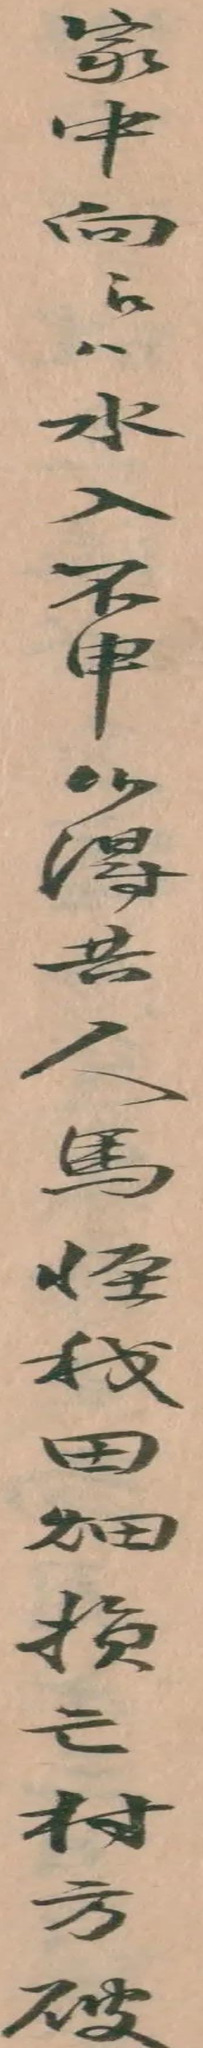家中向江ハ水入不申候得共人馬怪我田畑損亡村方破
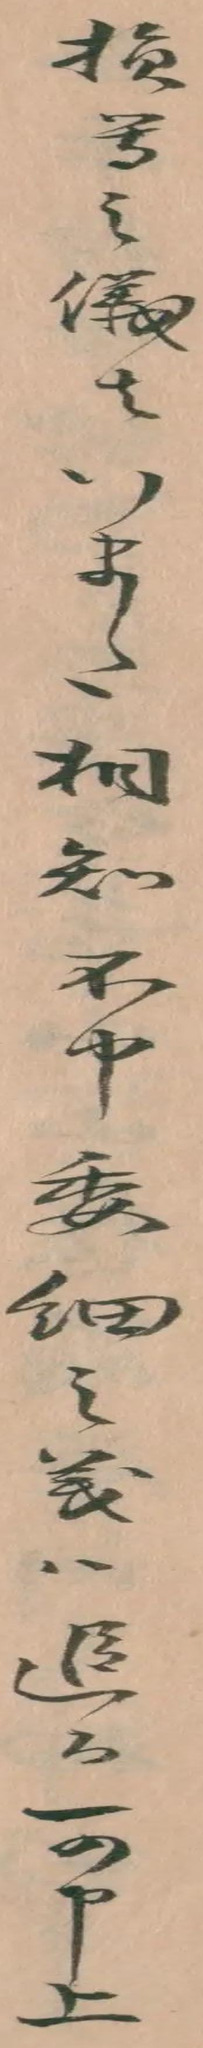損等之儀者いまた相知不申委細之義ハ追而可申上
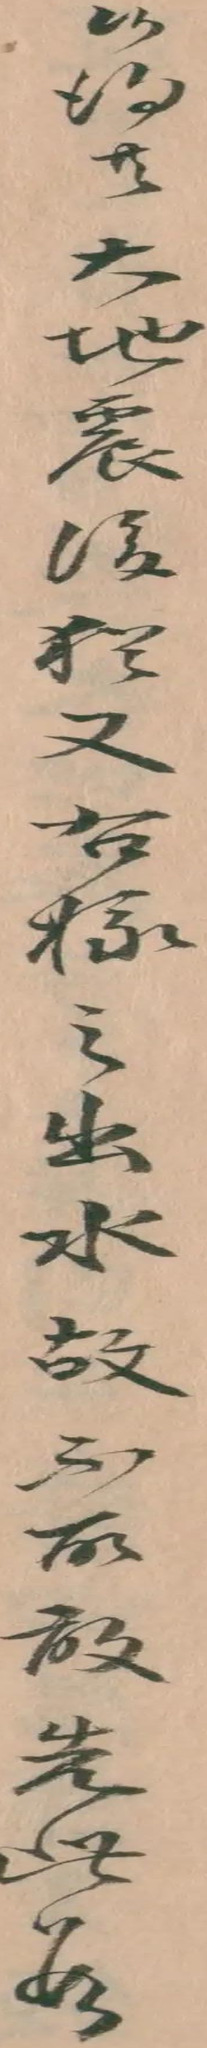候得共大地震後猶又右様之出水故不取敢先此段
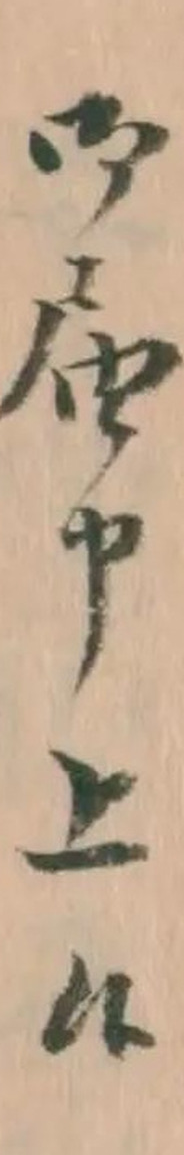御届申上候

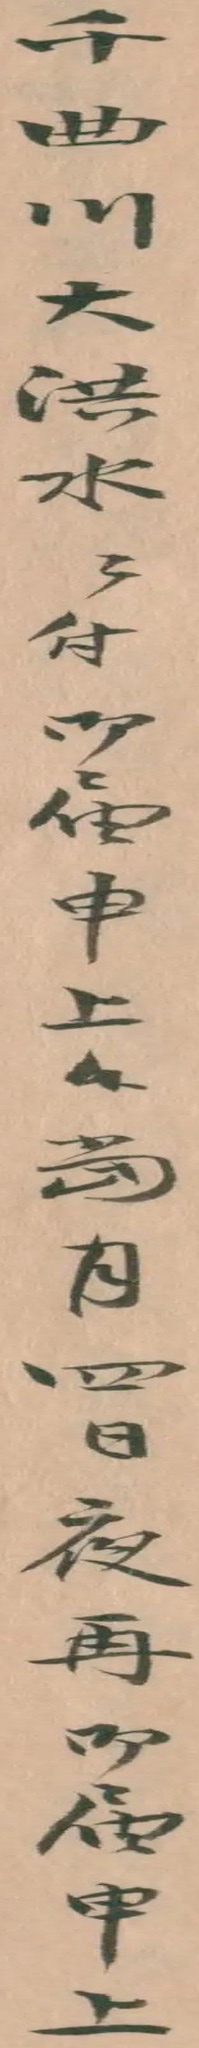千曲川大洪水二付御届申上候当月四日夜再御届申上
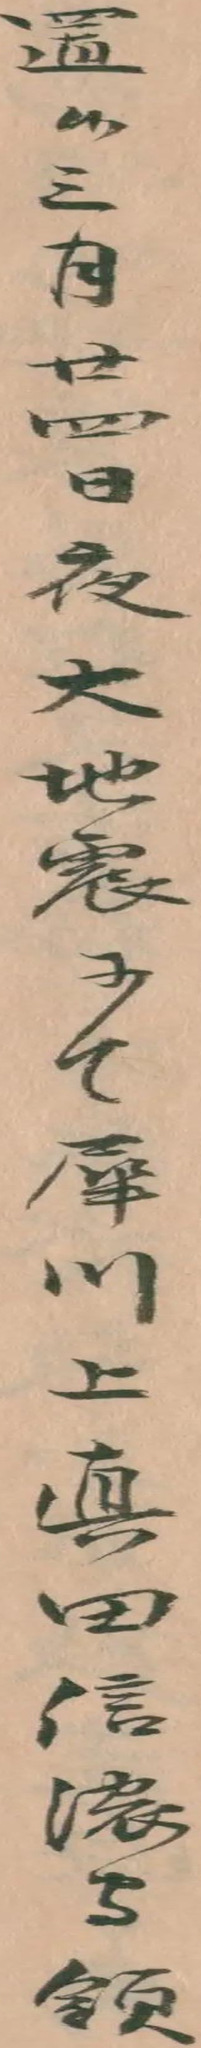置候三月廿四日夜大地震にて犀川上真田信濃守領
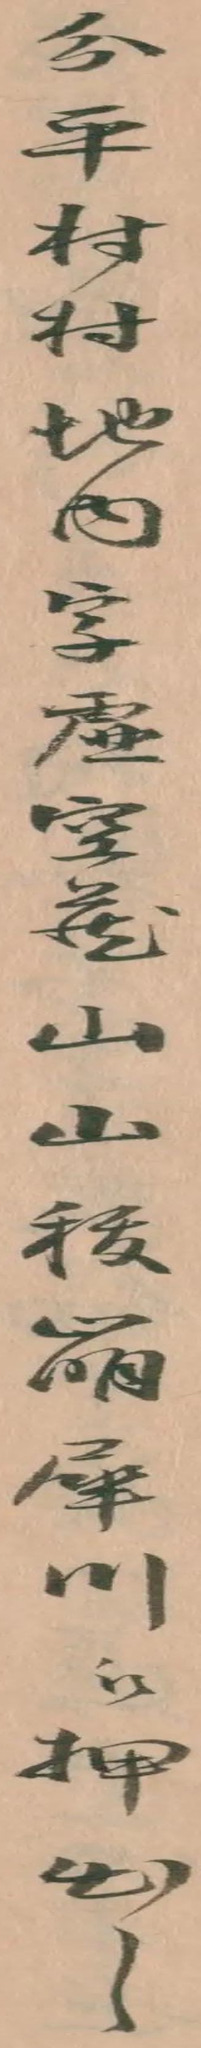分平林村地内字虚空蔵山山抜崩犀川江御師出し
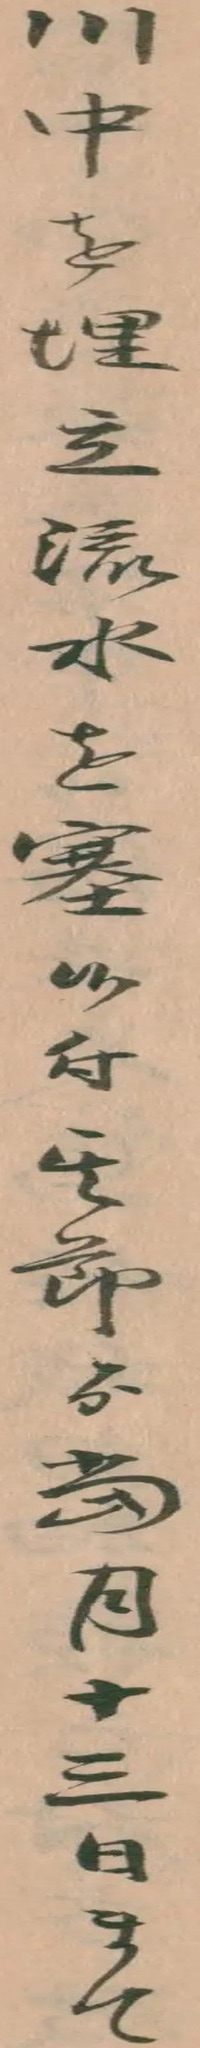川中を埋立流水を塞候付其節ゟ当月十三日まて
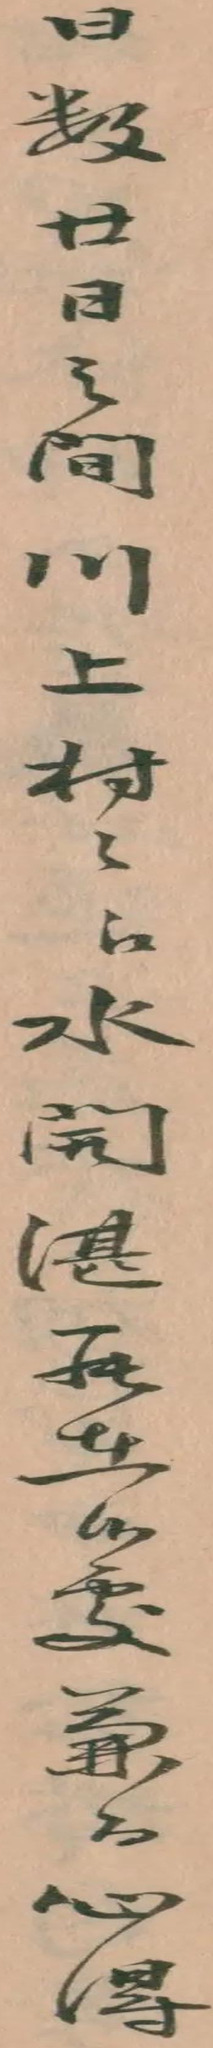日数廿日之間川上村々江水開湛罷在候処兼而心得
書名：地災撮要. 巻3(地震之部)-巻4(噴火之部)
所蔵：国立国会図書館 National Diet Library, JAPAN
